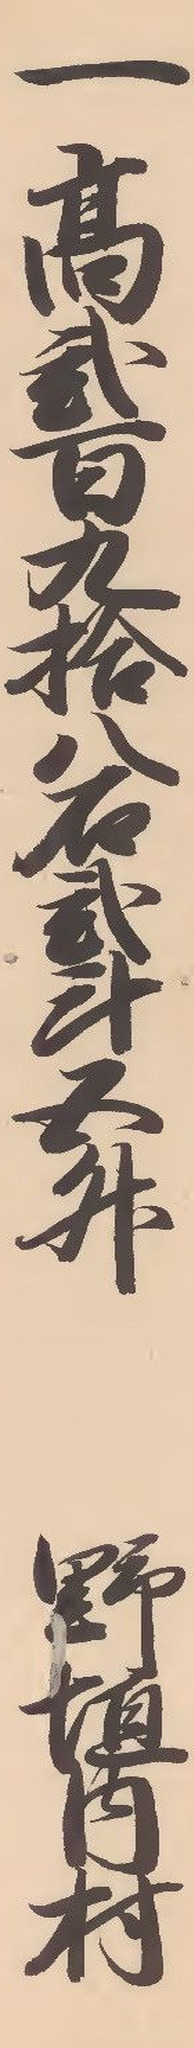一高弐百九拾八石弐斗五升野垣内村

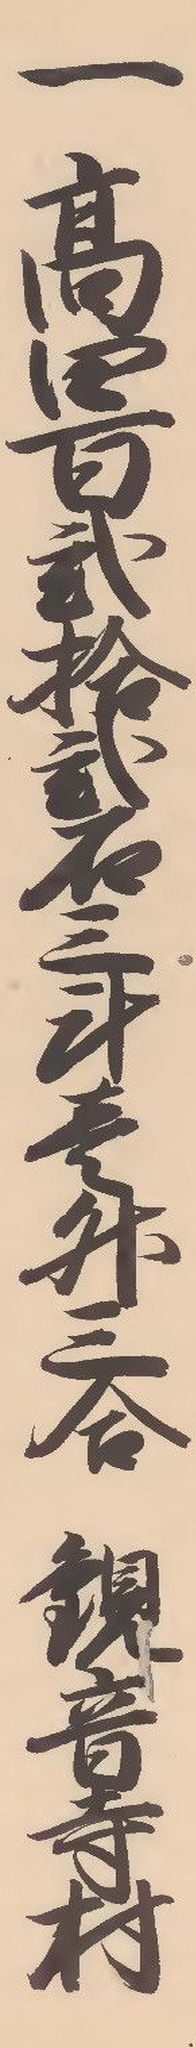一高四百弐拾弐石三斗壱升三合観音寺村
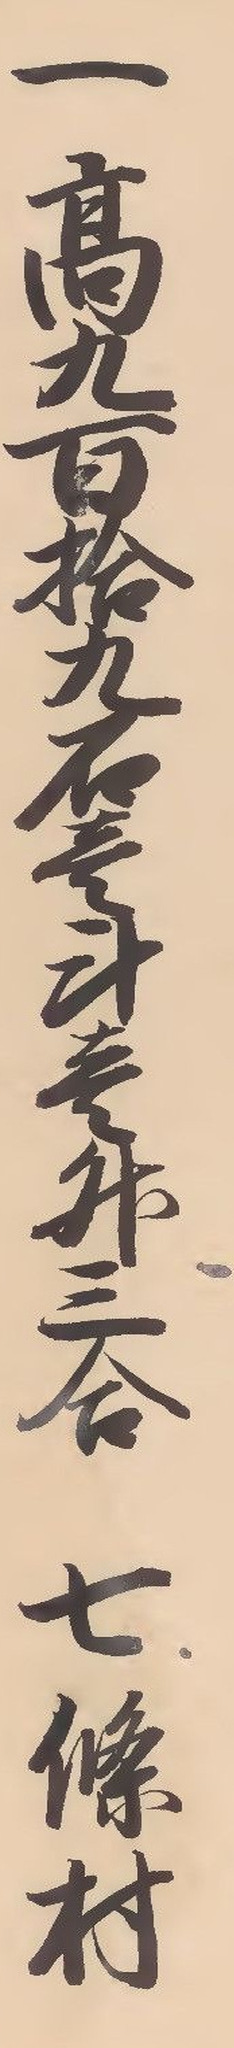一高九百拾九石壱斗壱升三合七条村
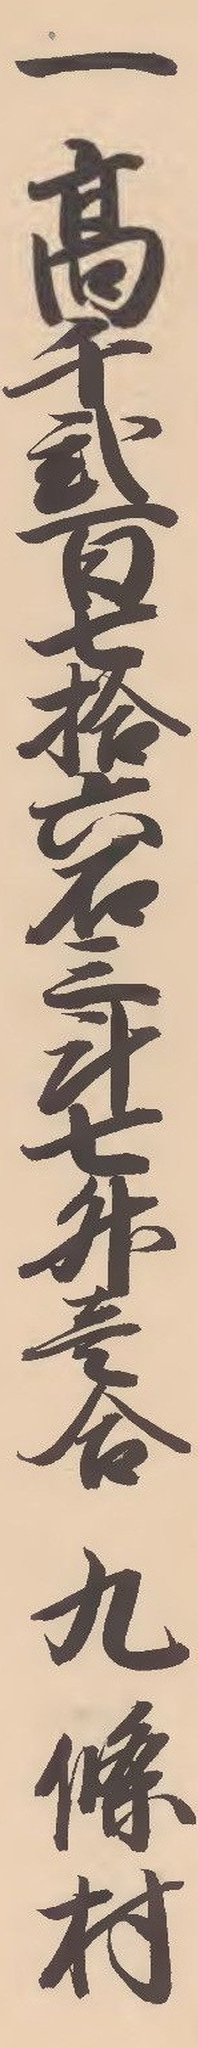一高千弐百七拾六石三斗七升壱合九条村
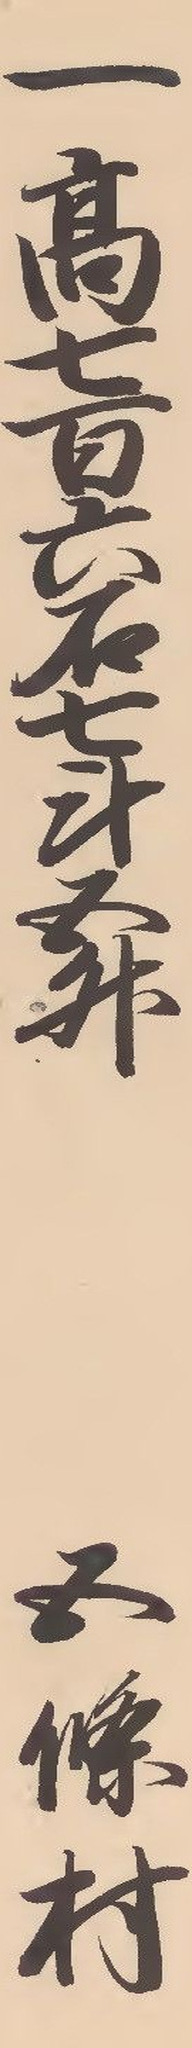一高七百六石七斗五升五条村
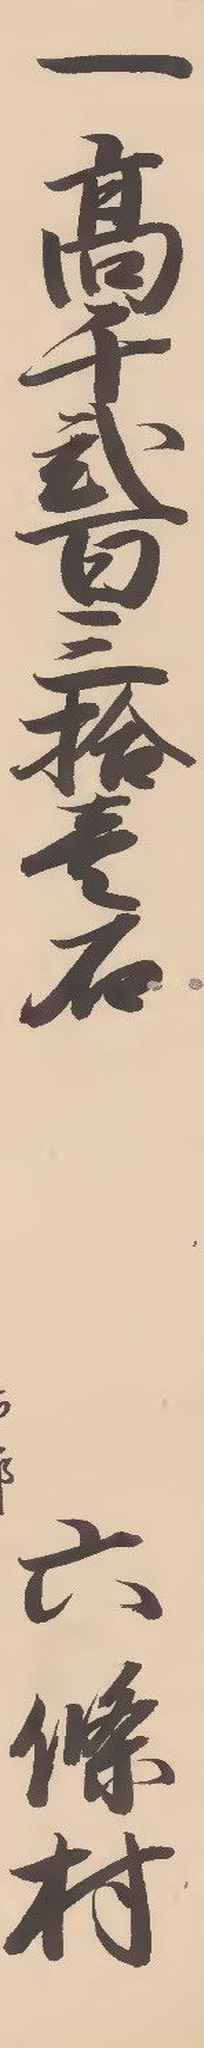一高千弐百三拾壱石六条村
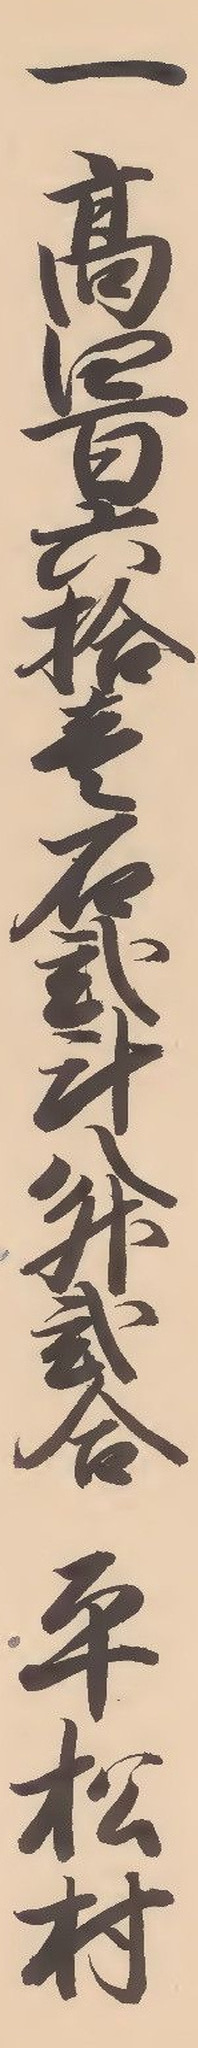一高四百六拾壱石弐斗八升弐合平松村

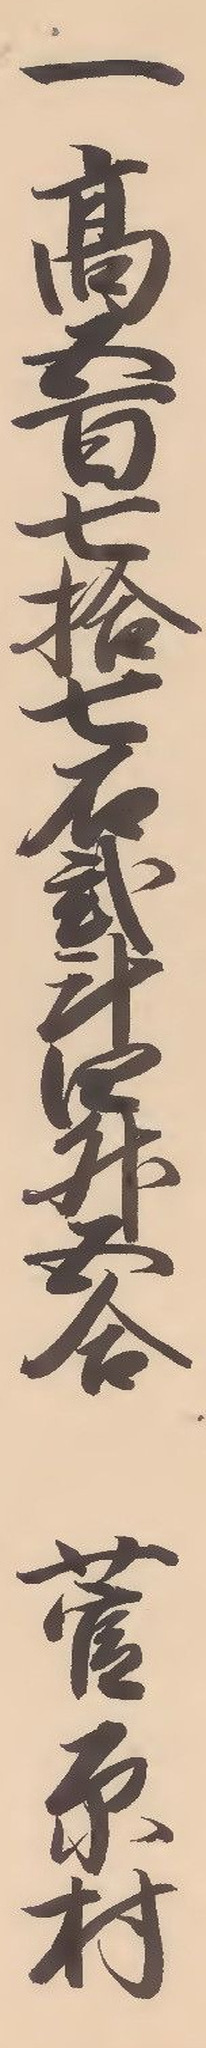一高五百七拾七石弐斗四升五合菅原村
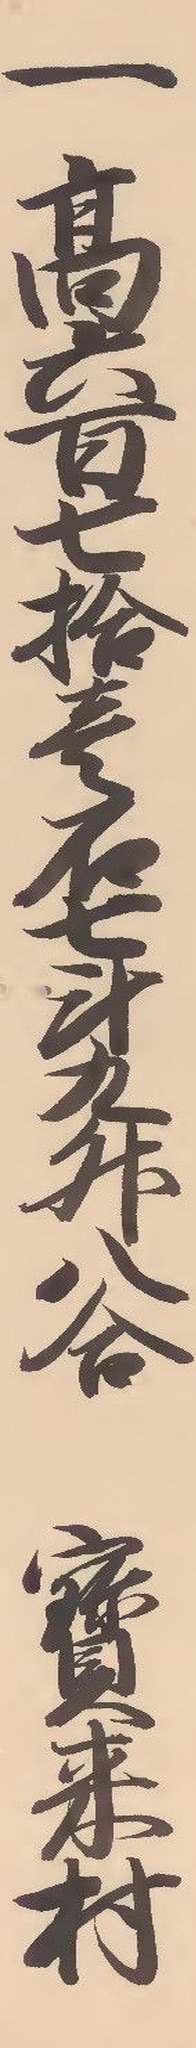一高六百七拾壱石七斗九升八合宝来村
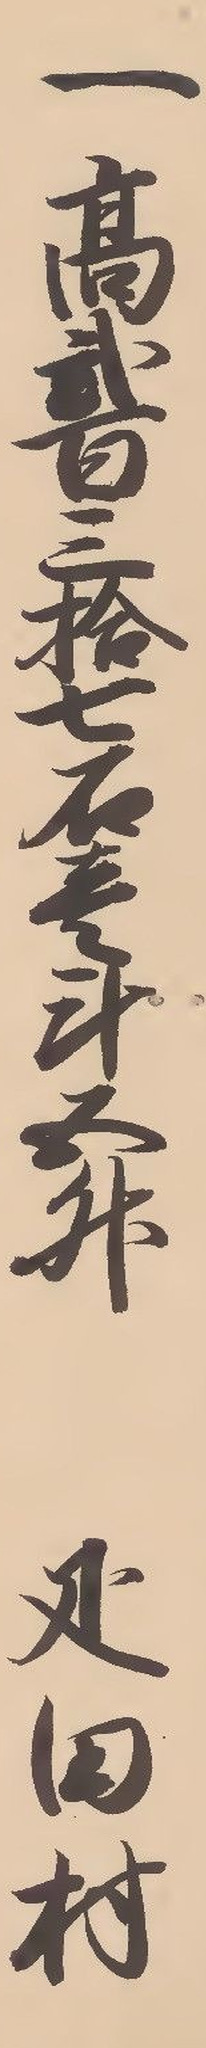一高弐百三拾七石壱斗五升疋田村
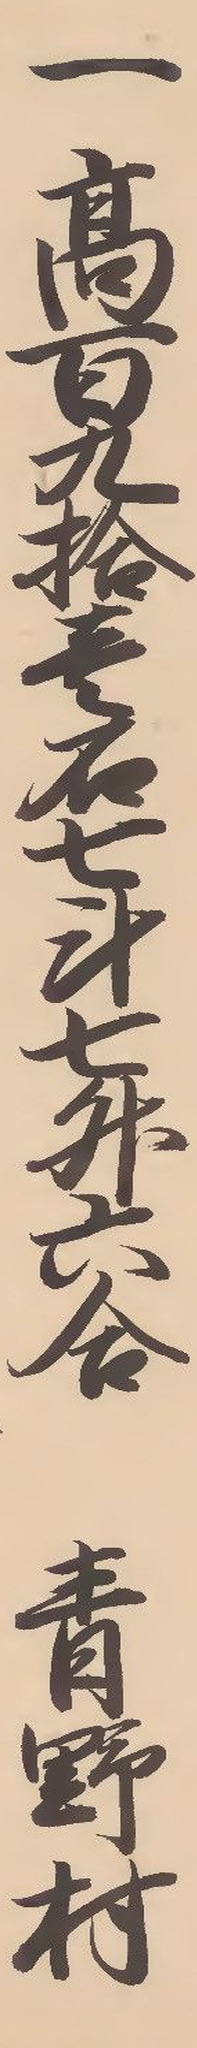一高百九拾壱石七斗七升六合青野村
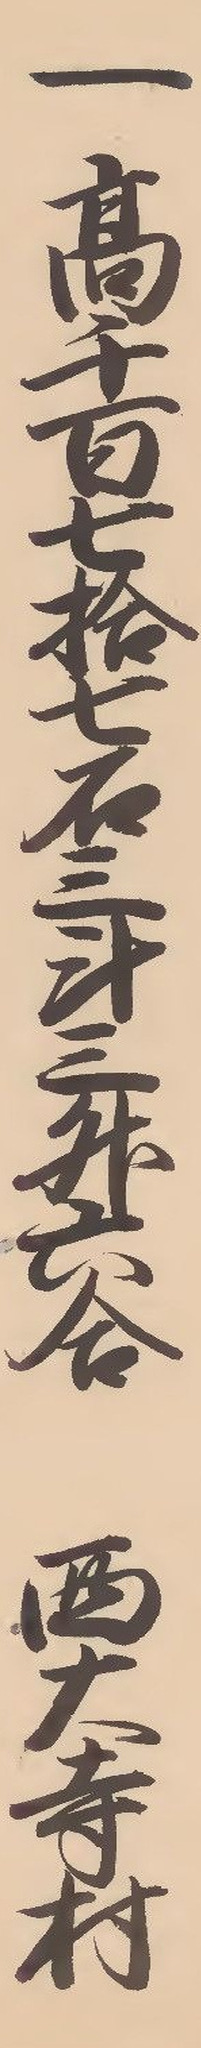一高千百七拾七石三斗三升六合西大寺村
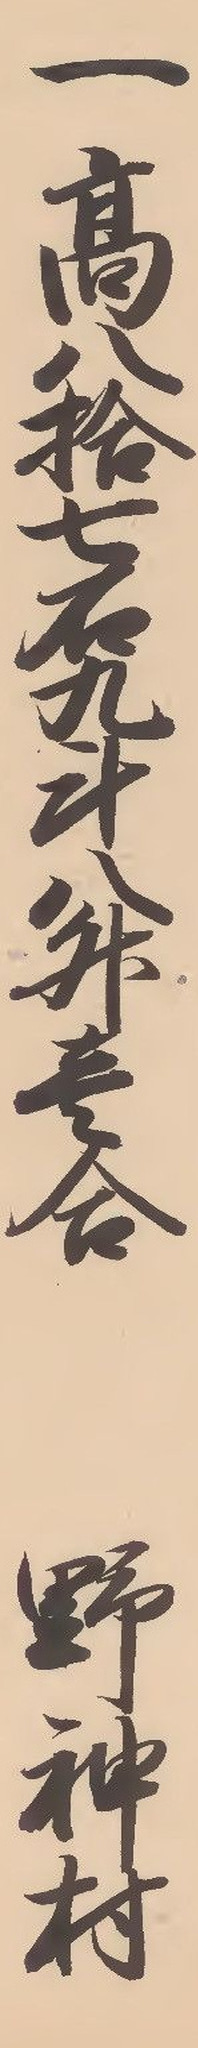一高八拾七石九斗八升壱合野神村

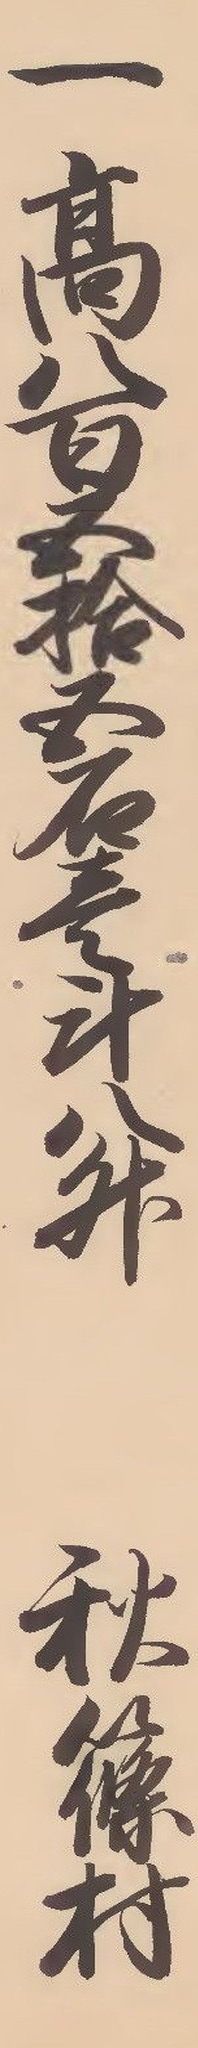一高八百五拾五石壱斗八升秋篠村
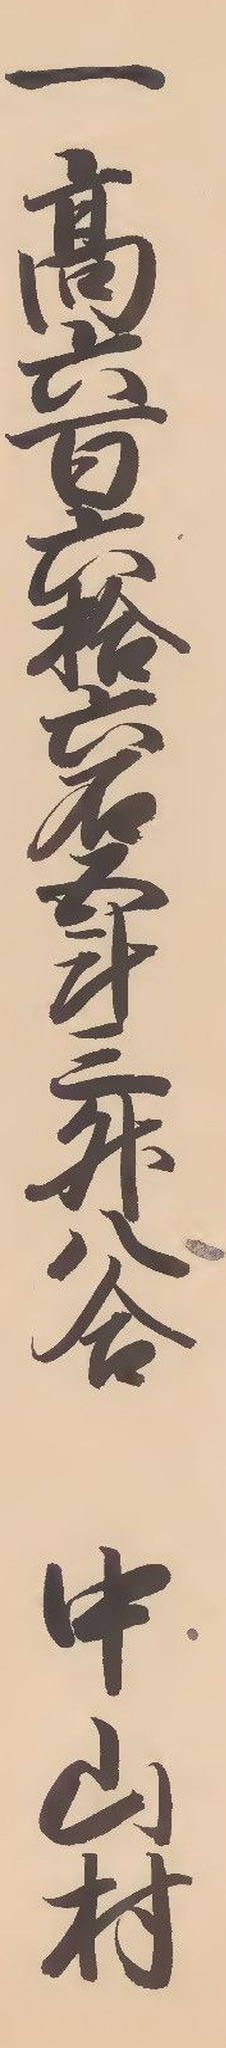一高六百六拾六石五斗三升八合中山村
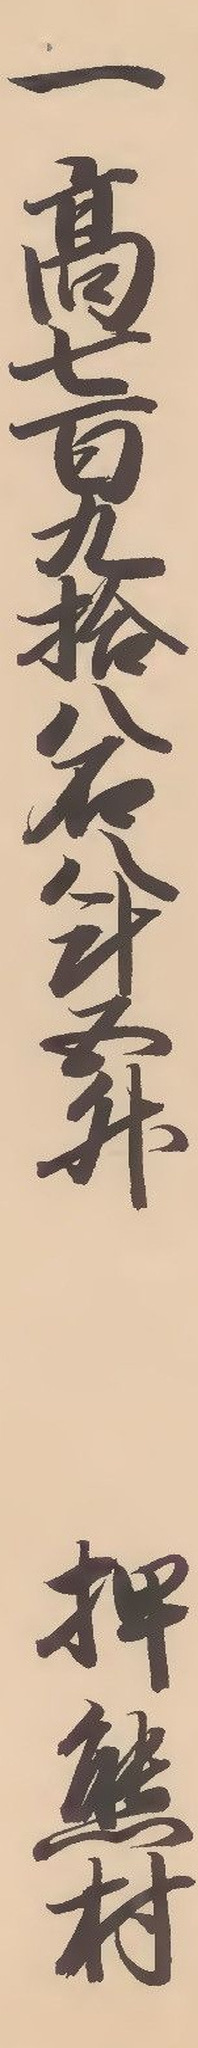一高七百九拾八石八斗五升押熊村
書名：大和国郷帳
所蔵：国立公文書館 National Archives of Japan
